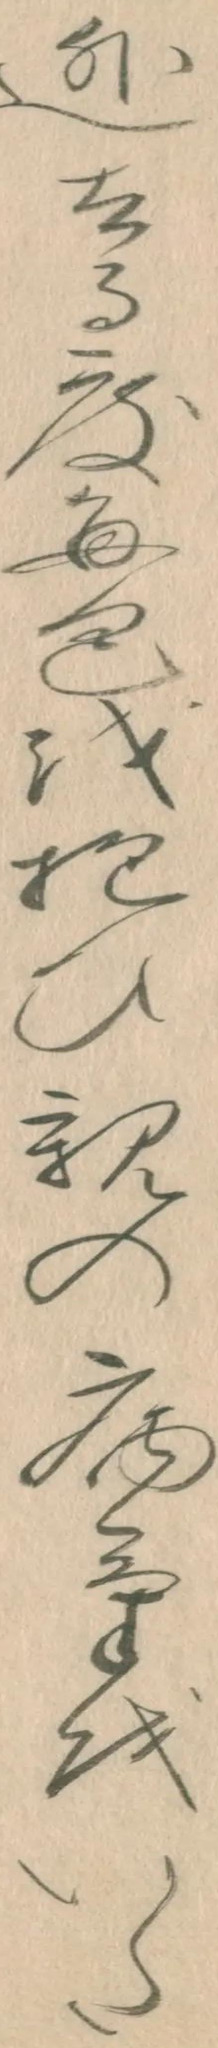逃たる度毎包を抱ひ親の病気をいた
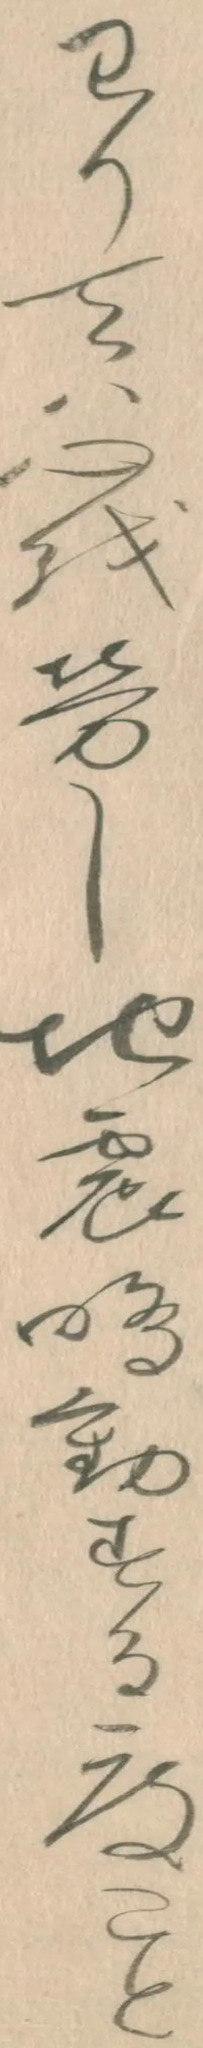わりては心を労し地震鳴動する度こと
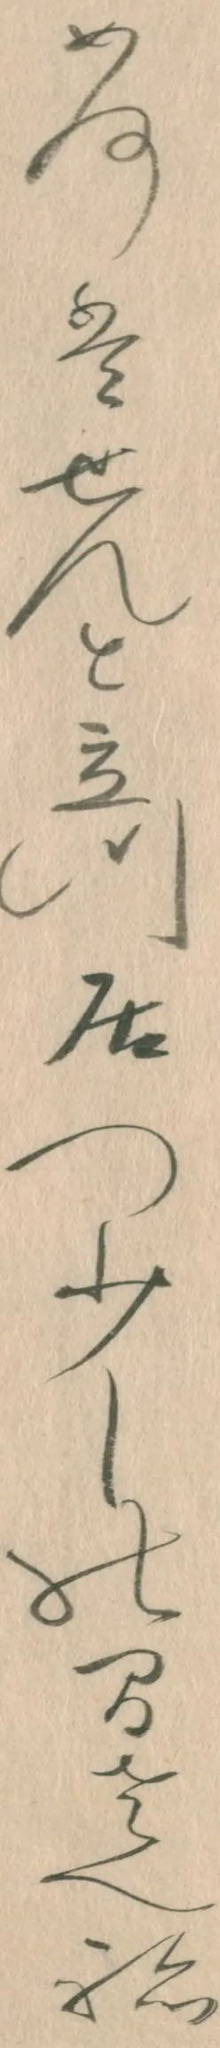如何はせんと立つ居つ少しの間さへね
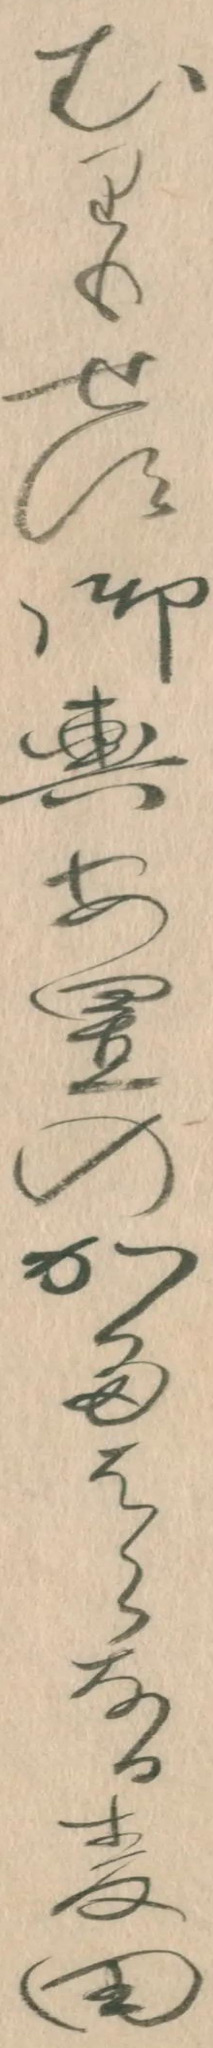むりもせす御輿安置のかたはらなる麦田
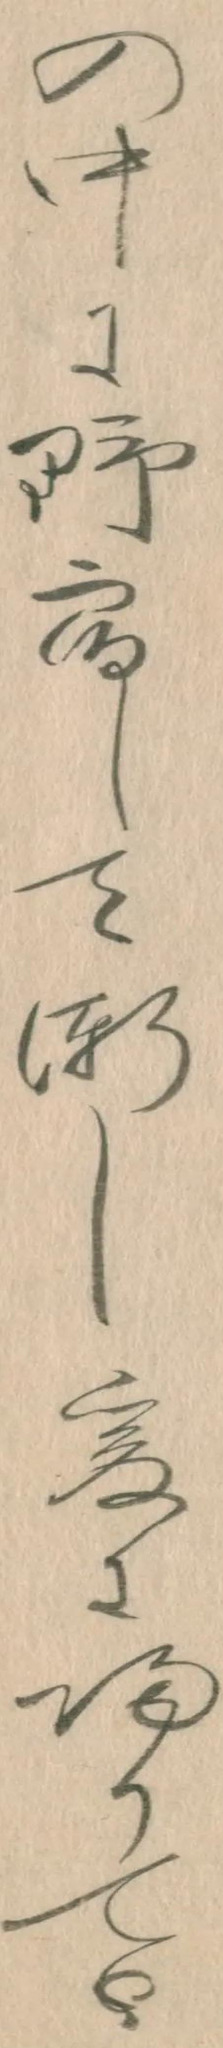の中に野宿して漸し爰に帰りても
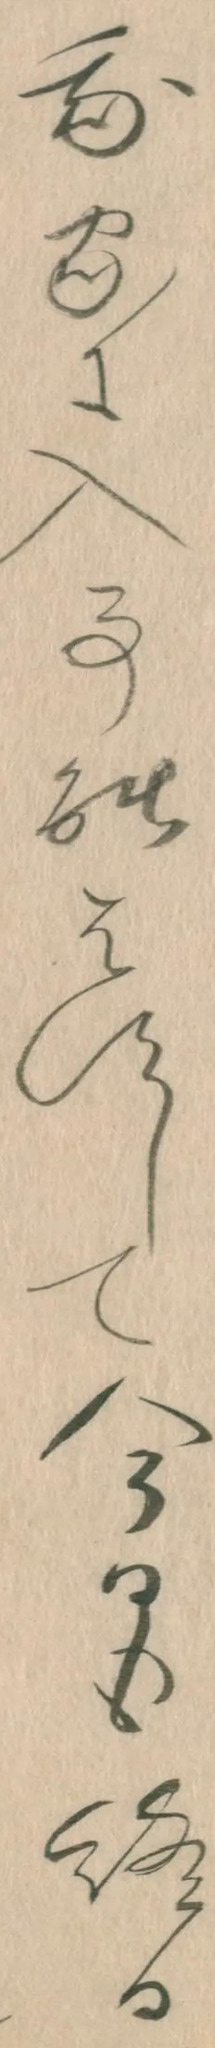我家に入事能はすして今日も終日
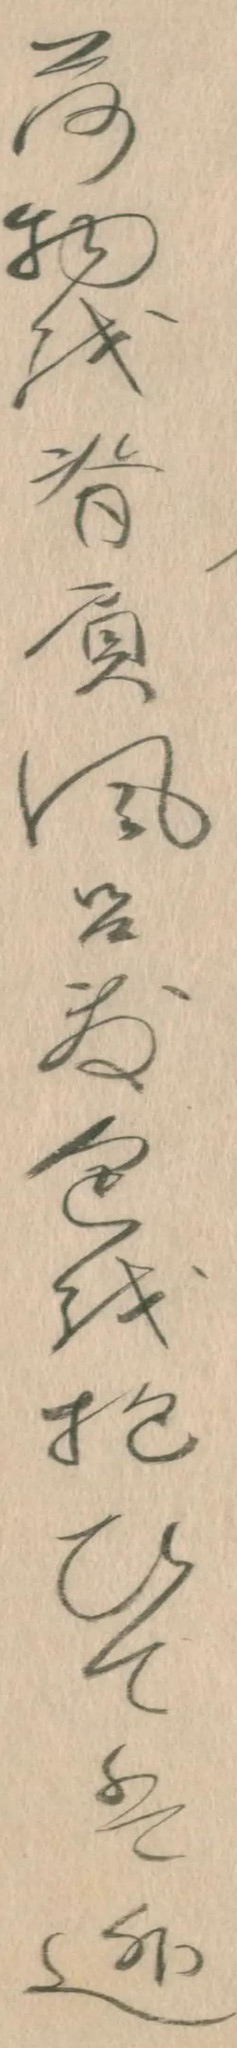荷物を背負風呂敷包を抱ひては逃
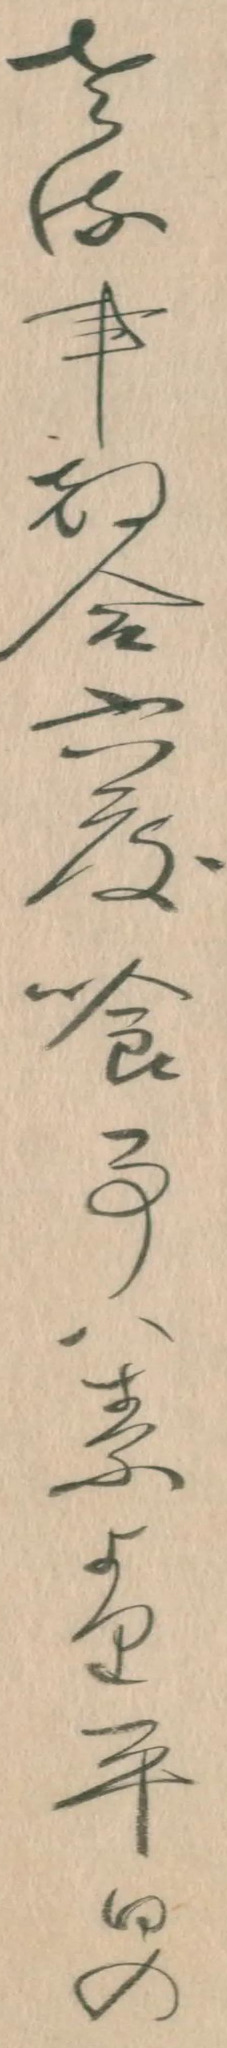さる事都合六度喰事は素より平日の
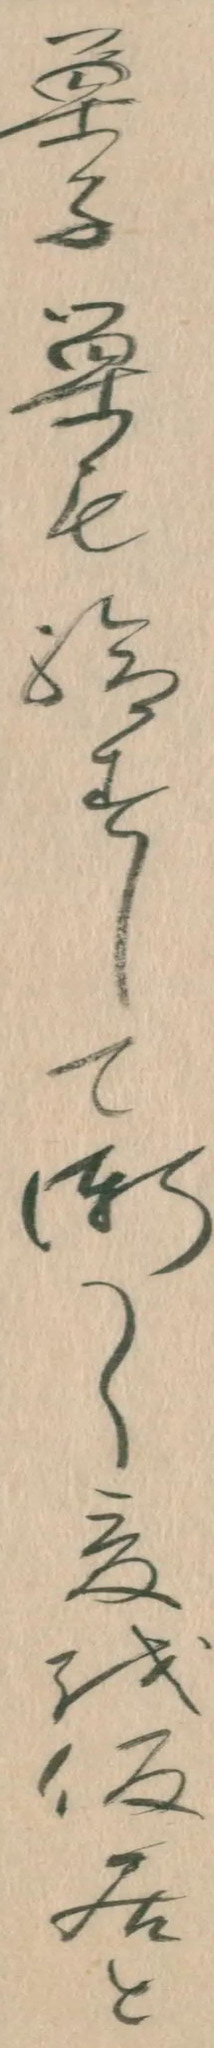菓子菓も給すして漸く爰を仮居と
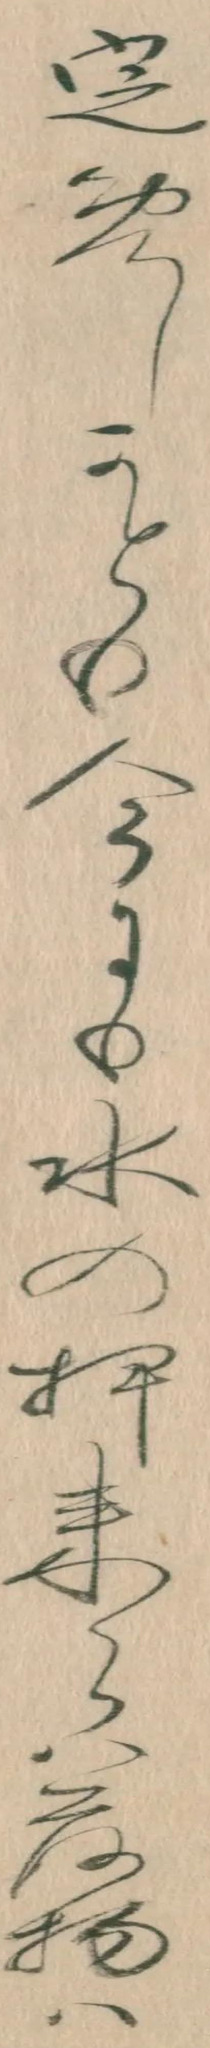定めしかとも今にも水の押来らは荷物は
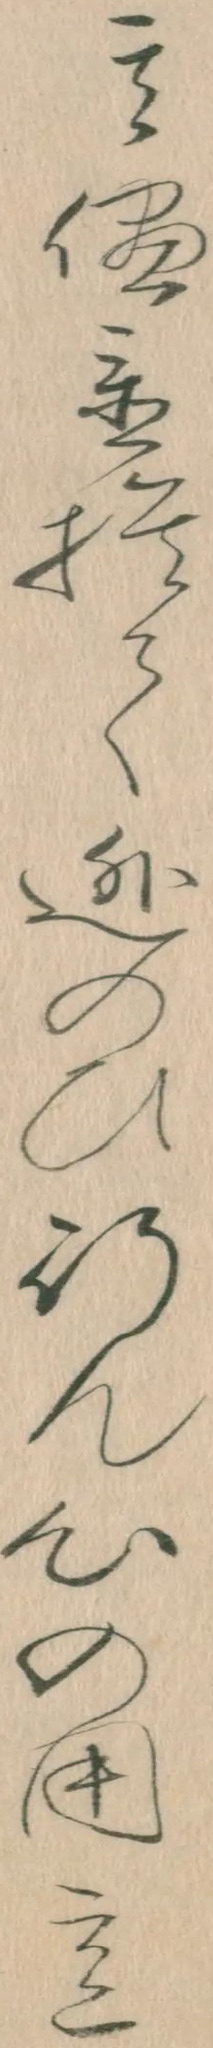其儘置捨て逃のひ行ん心の用意
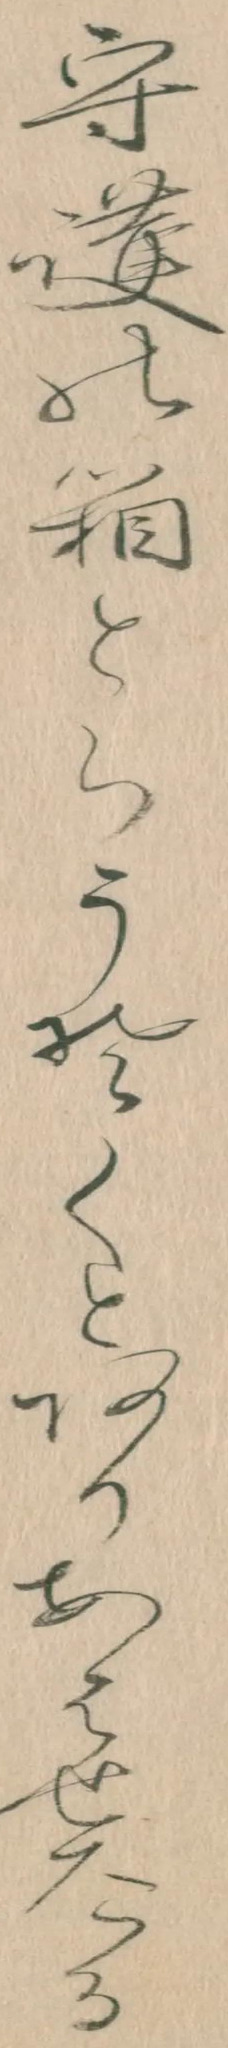守護の箱とらうそくとありあはせたる
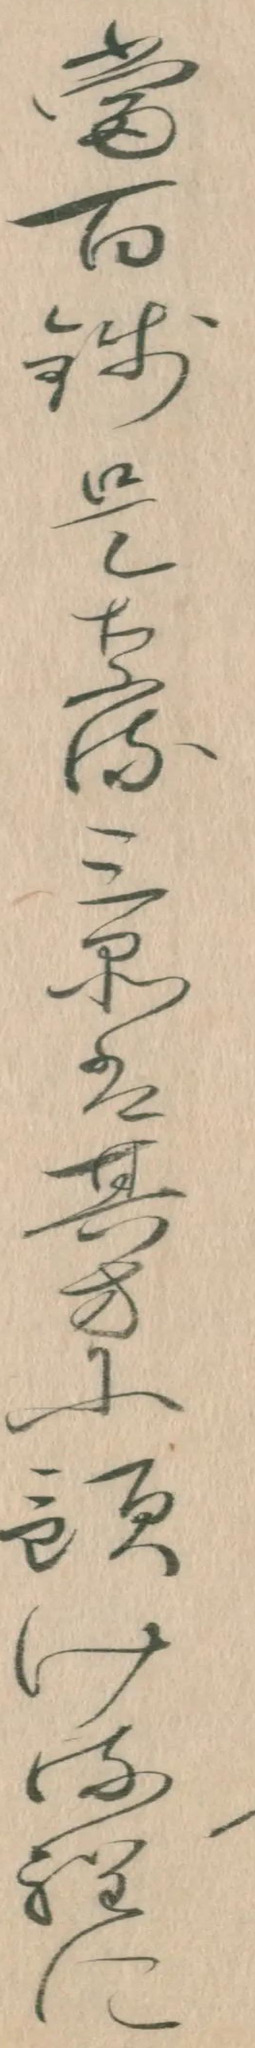当百銭是なる三品は其方に預ける程に
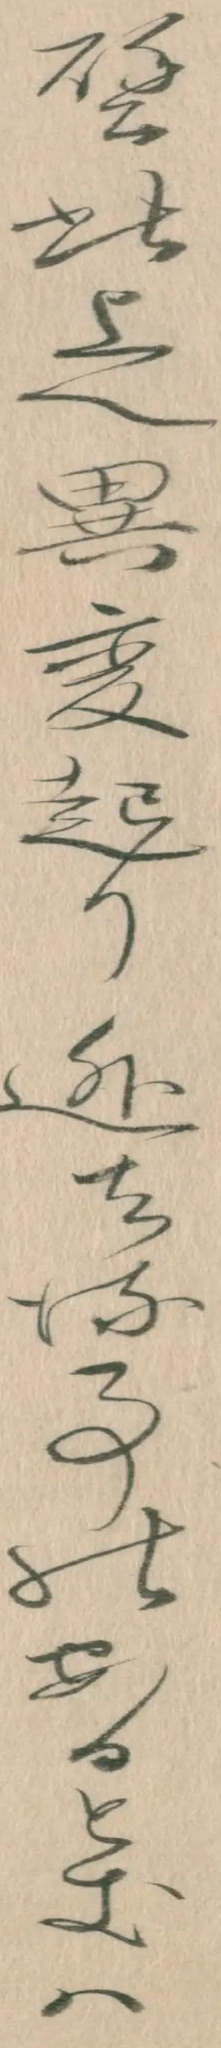譬此上へ異変起り逃去る事のあるときは
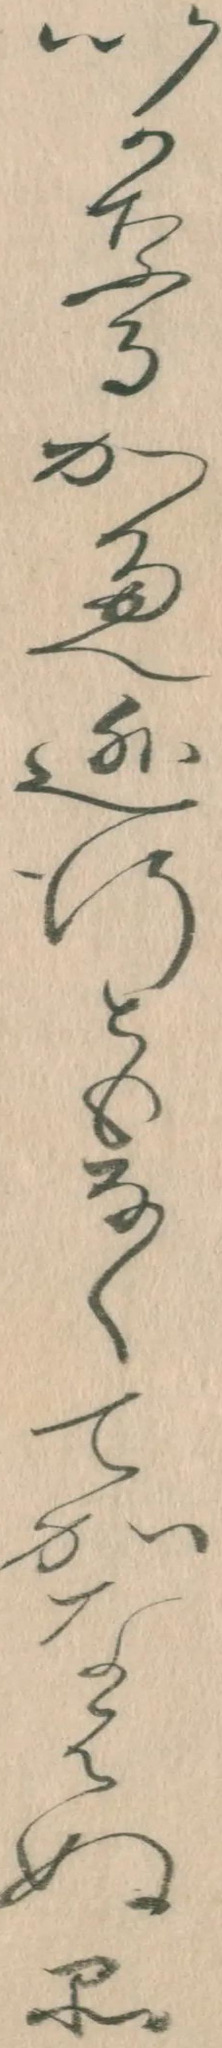いかなるかたへ逃行ともなくてかなはぬ品
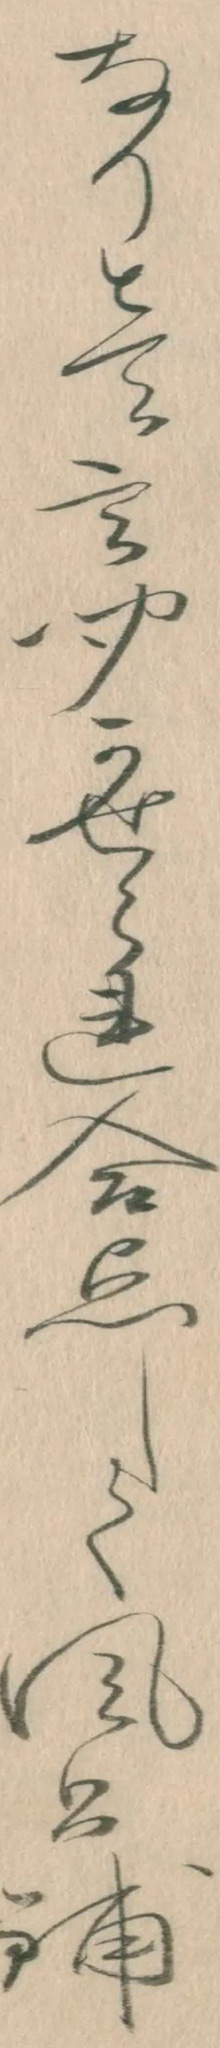なりとて言聞かせられ合点して風呂鋪
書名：俗語之種. [5]
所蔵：国立国会図書館 National Diet Library, JAPAN
